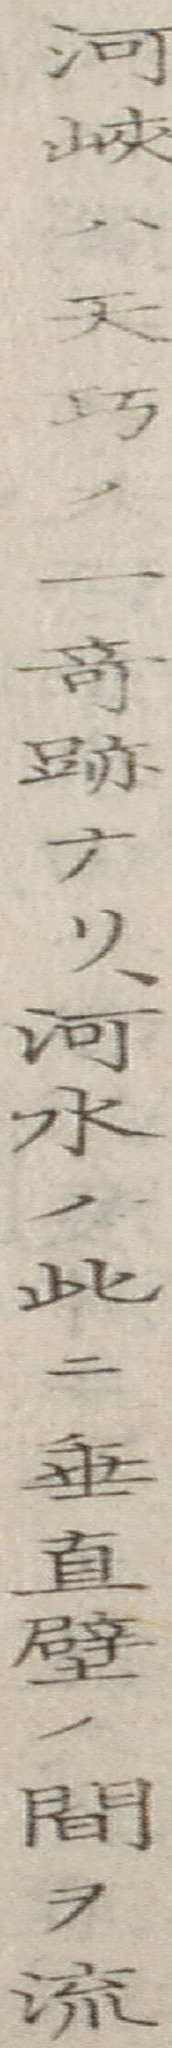河峡ハ天巧ノ一奇跡ナリ、河水ノ此ニ垂直壁ノ間ヲ流
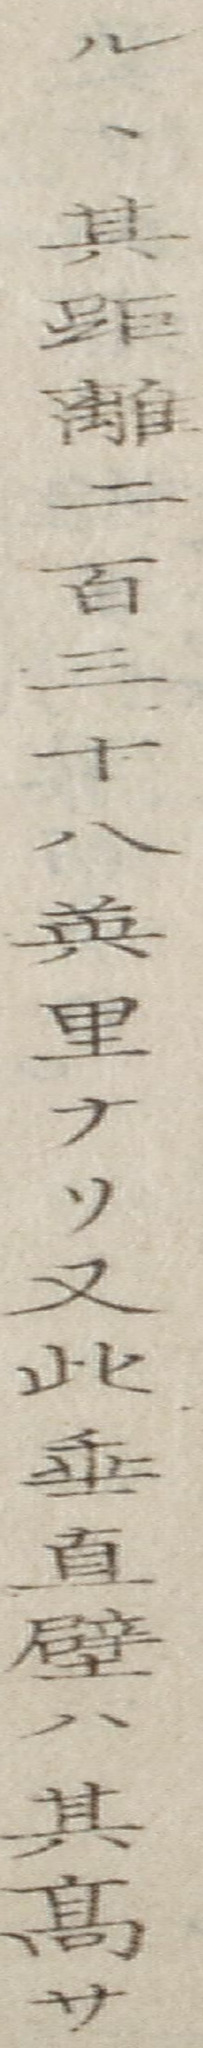ルヽ其距離二百三十八英里ナリ又北垂直壁ハ其高サ
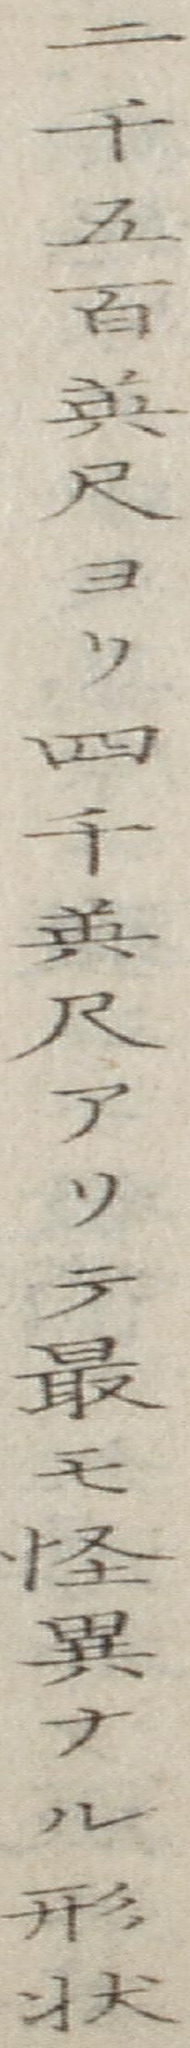二千五百英尺ヨリ四千英尺アリテ最モ怪異ナル形状
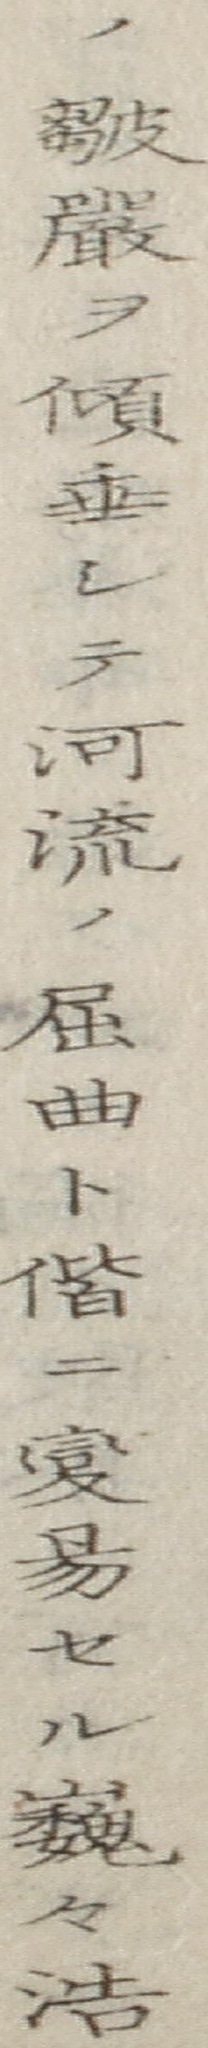ノ皺厳ヲ傾垂シテ河流ノ屈曲ト偕ニ変易セル巍々浩
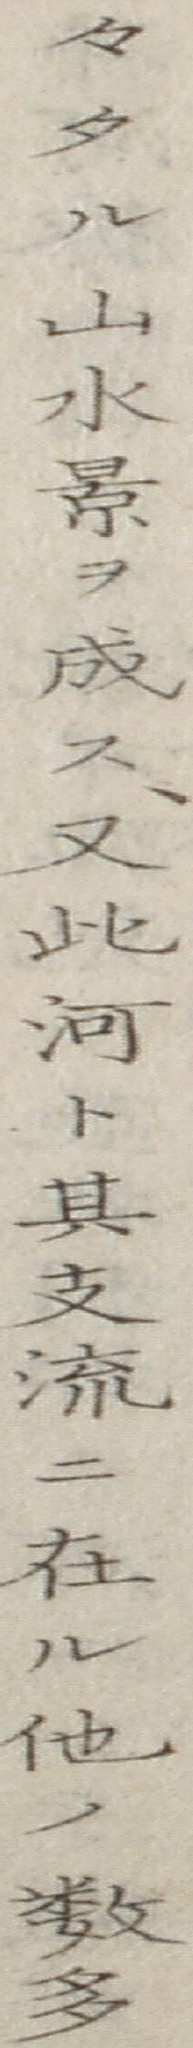々タル山水景ヲ成ス、又此河ト其支流ニ在ル他ノ数多
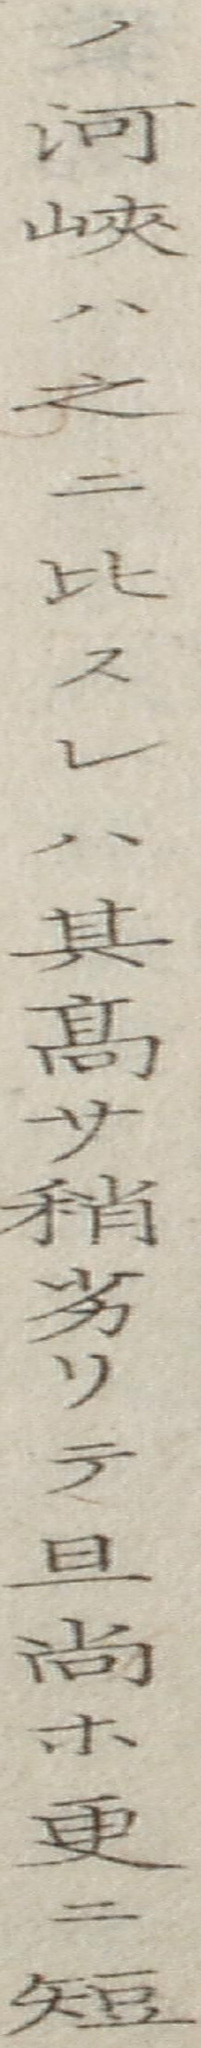ノ河峡ハ之ニ比スレハ其高サ稍劣リテ旦尚ホ更ニ短
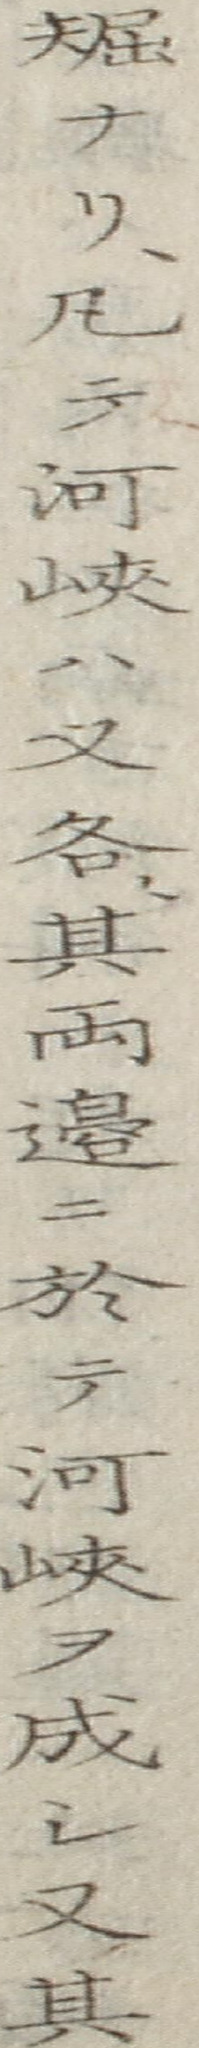掘ナリ、凡テ河峡ハマタ各其両辺ニ於テ河峡ヲ成シ又其
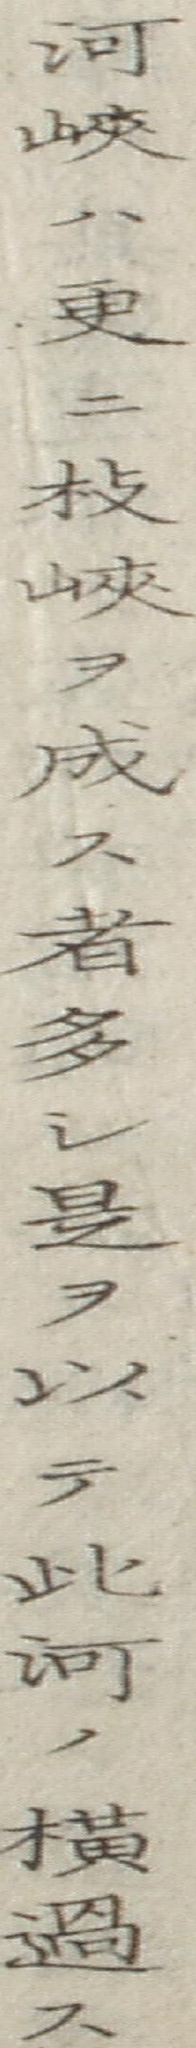河峡ハ更ニ枝峡ヲ成ス者多シ是ヲ以テ此河ノ横過ス
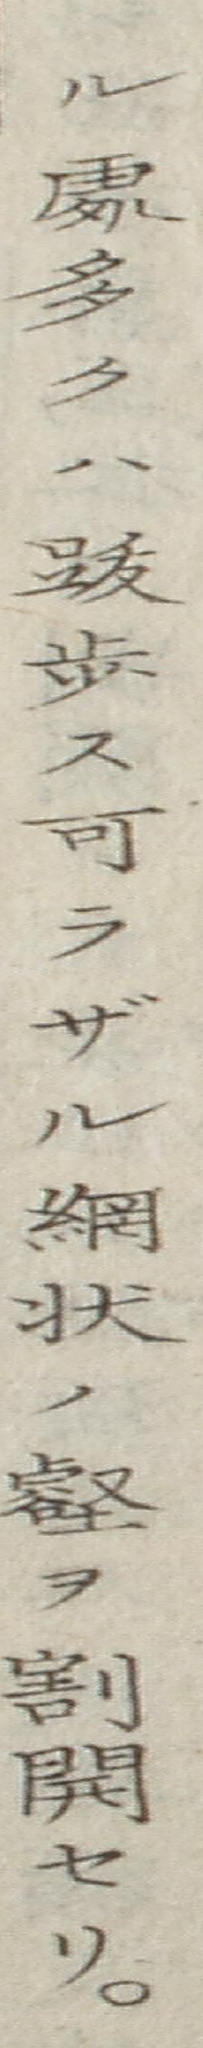ル処多クハ跋歩ス可ラザル網状ノ壑ヲ割開セリ。
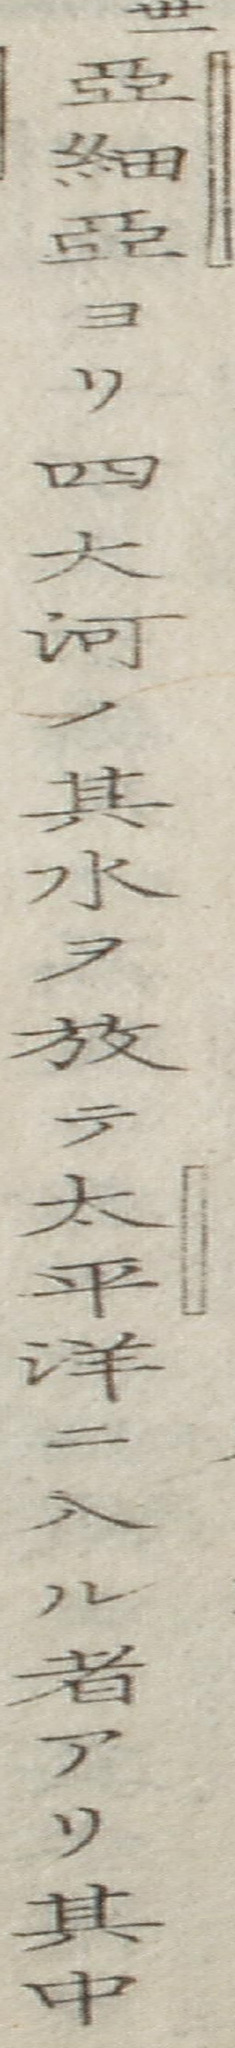丗一亜細亜ヨリ四大河ノ其水ヲ放テ太平洋ニ入ル者アリ其中
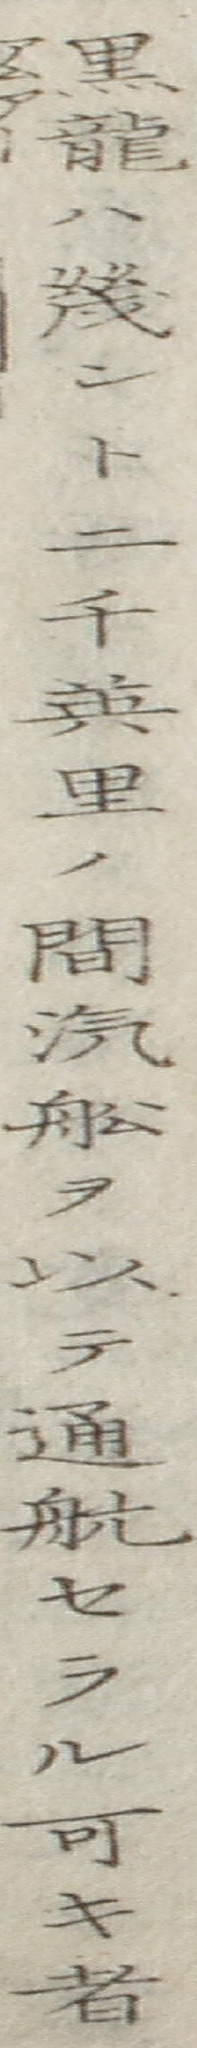黒龍ハ幾ント二千英里ノ間汽舩ヲ以テ通航セラル可キ者
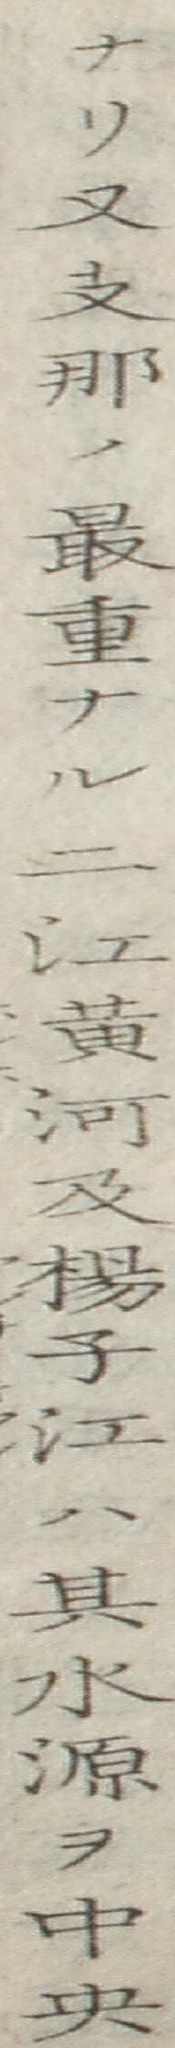ナリ又支那ノ最重ナル二江黄河及揚子江ハ其水源ヲ中央
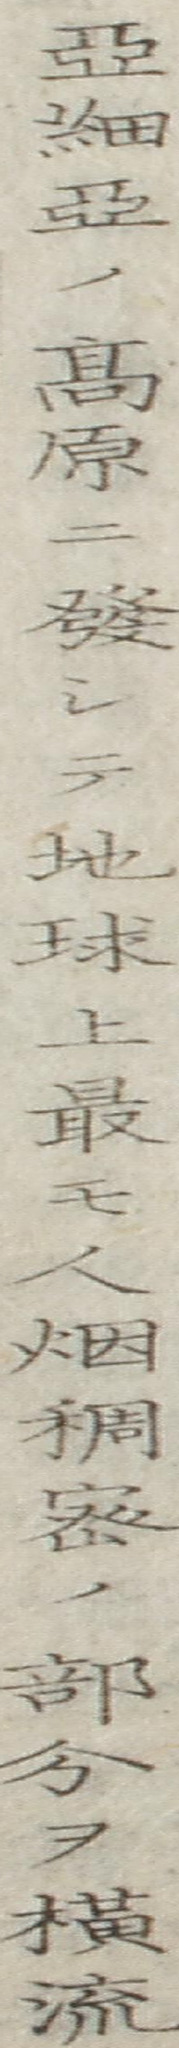亜細亜ノ高原ニ発シテ地球上最モ人煙稠密ノ部分ヲ横流
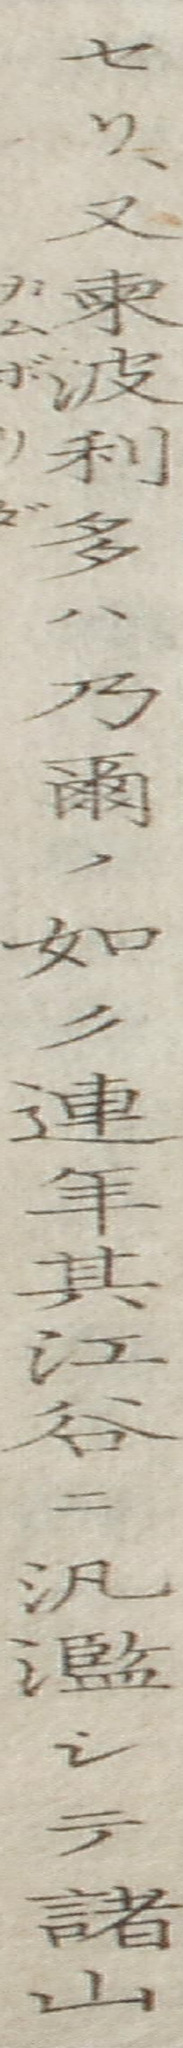セリ、又東波利多ハ乃爾ノ如ク連年其江谷ニ汎濫シテ諸山
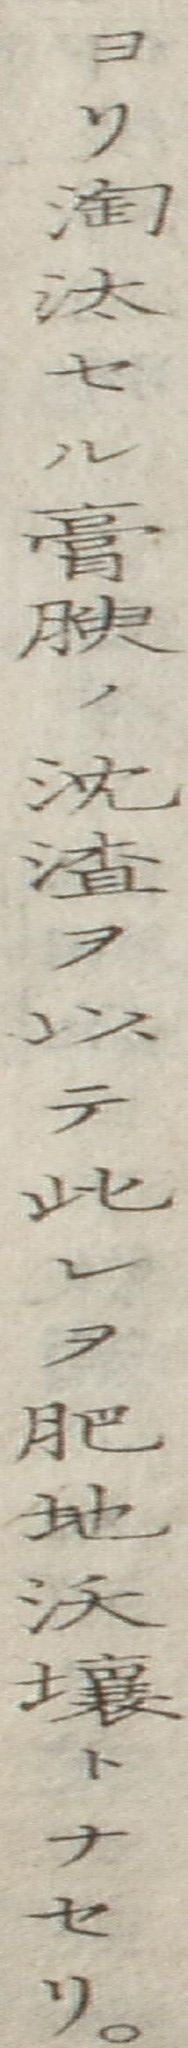ヨリ淘汰セル膏腴ノ沈渣ヲ以テ此レヲ肥地沃壌トナセリ。

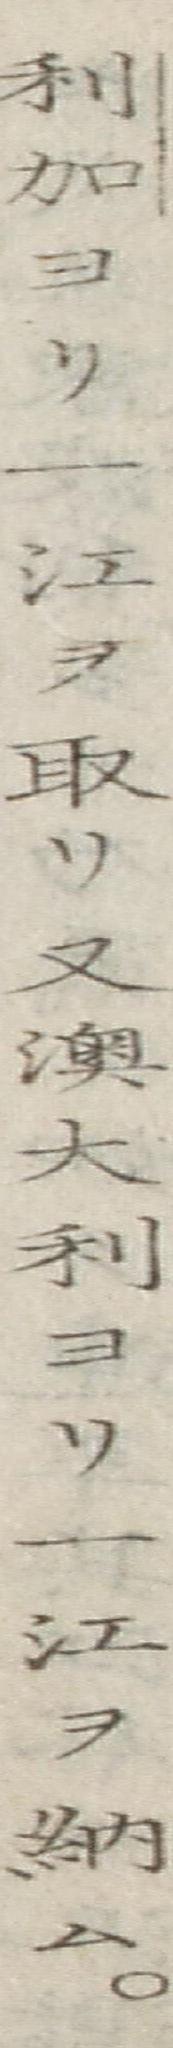利加ヨリ一江ヲ取リ又濠太利ヨリ一江ヲ納ム。
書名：地形論　巻二
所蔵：東京大学地震研究所図書室 Earthquake Research Institute Library, The University of Tokyo, JAPAN
